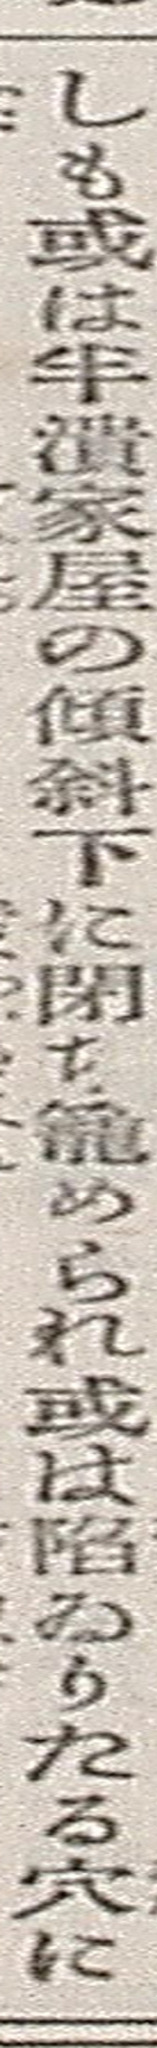しも或は半潰家屋の傾斜下に閉ぢ籠められ或は陥ゐりたる穴に
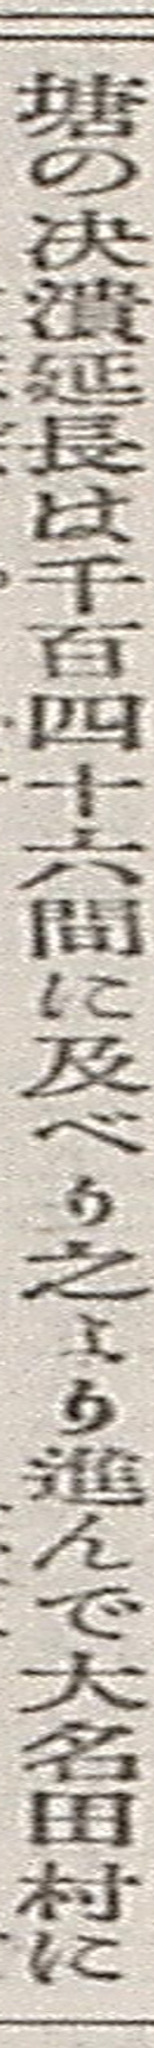塘の决潰延長は千百四十六間に及べり之より進んで大名田村に
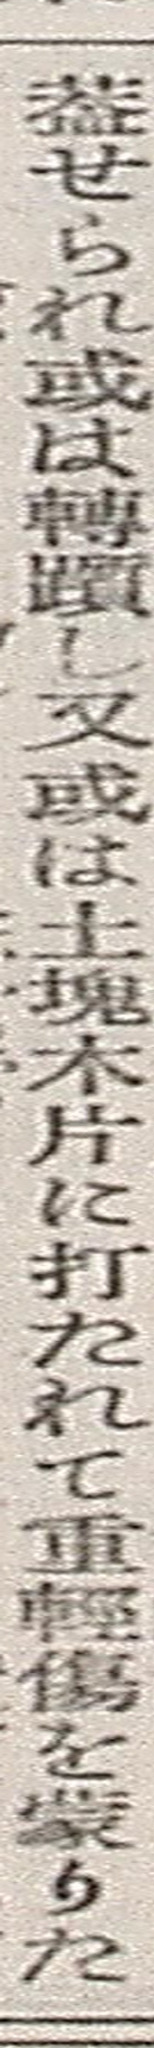蓋せられ或は転躓し又或は土塊木片に打たれて重軽傷を蒙りた
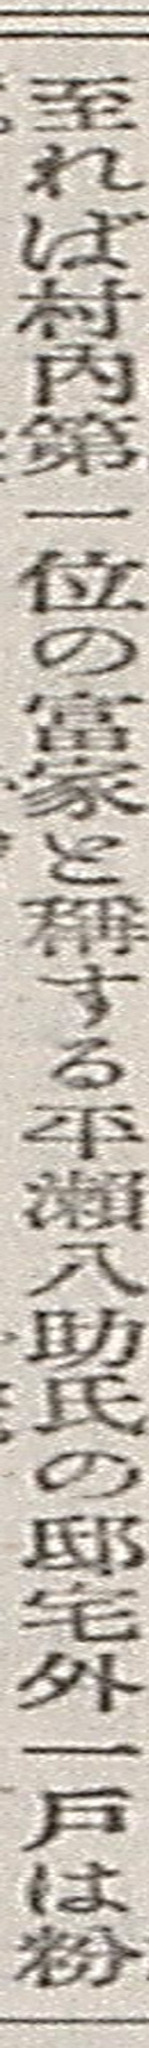至れば村内第一位の富家と称する平瀬八助氏の邸宅外一戸は粉
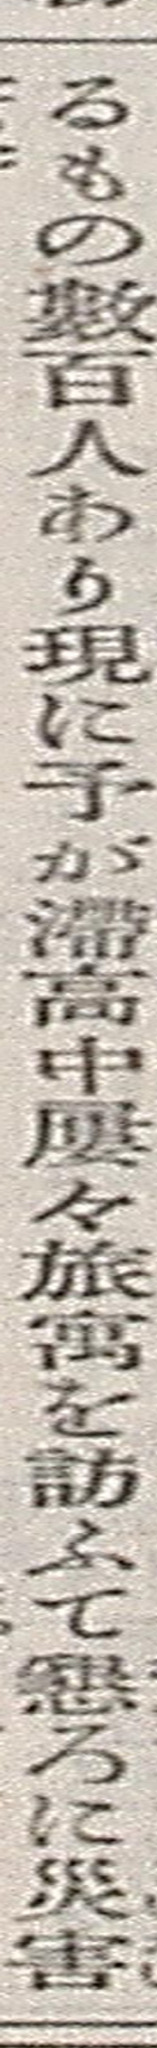るもの数百人あり現に予が滞高中屡々旅寓を訪ふて懇ろに災害
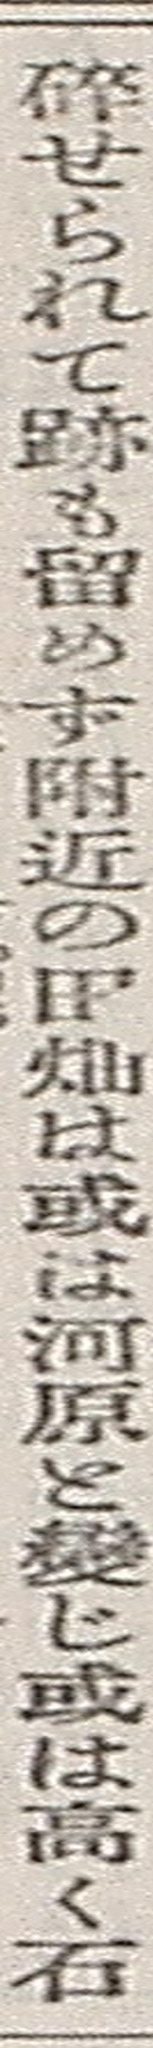砕せられて跡も留めず附近の田畠は或は河原と変じ或は高く石
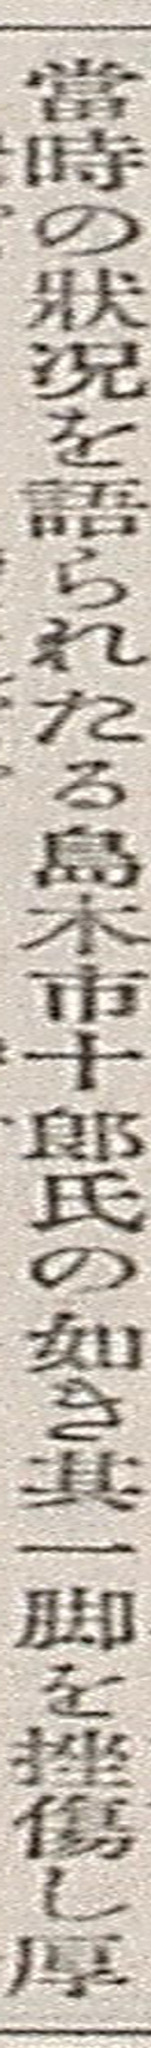当時の状況を語られたる島木市十郎氏の如き其一脚を挫傷し厚
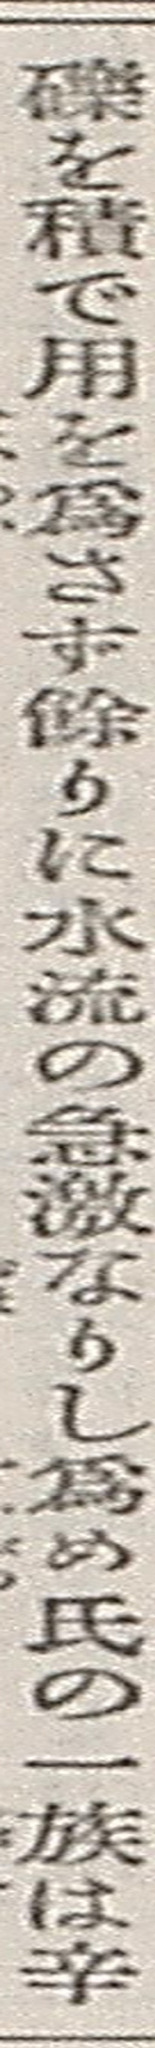礫を積で用を為さず餘りに水流の急激なりし為め氏の一族は辛
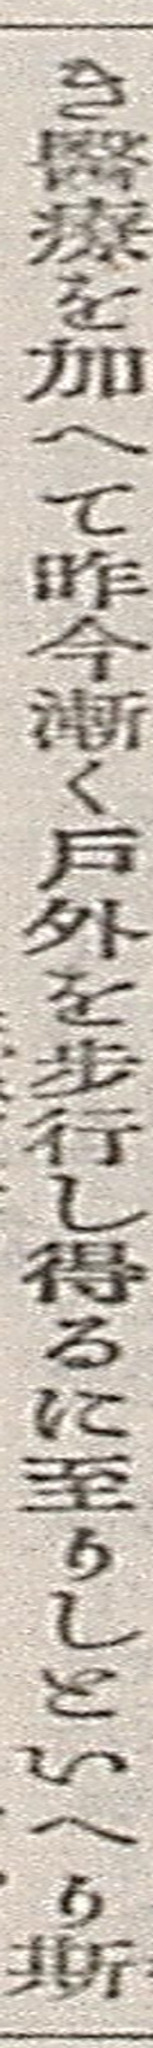き療養を加へて昨今漸く戸外を歩行し得るに至りしといへり斯
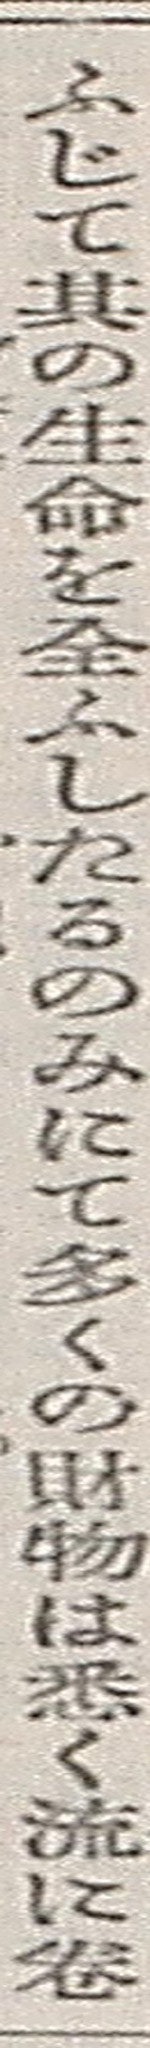ふじて其の生命を全ふしたるのみにて多くの財物は尽く流に巻
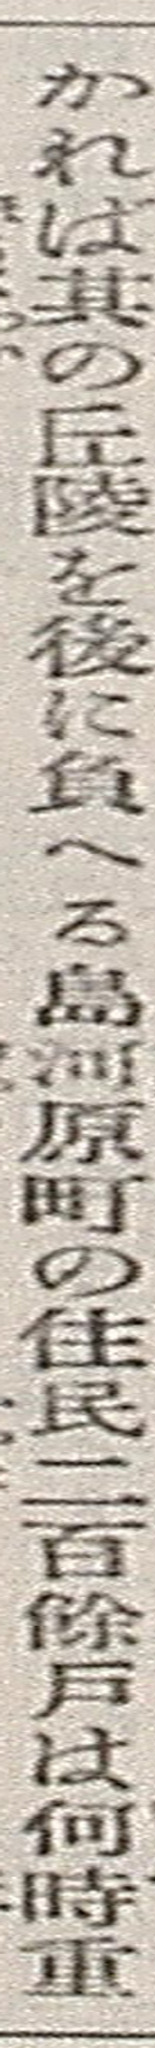かれば其の丘陵を後に負へる島河原町の住民二百餘戸は何時重
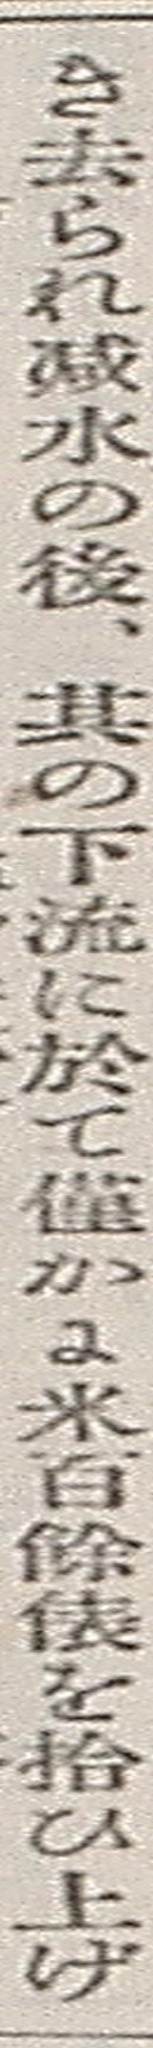き去られ減水の後、其の下流に於て僅かに米百餘俵を拾ひ上げ
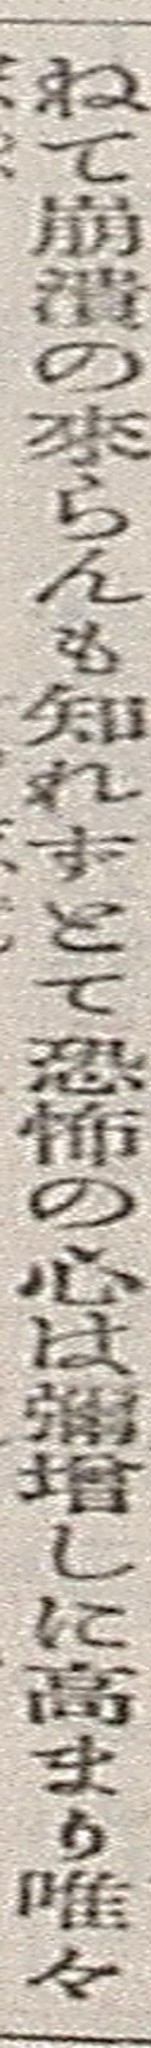ねて崩潰の来らんも知れずとて恐怖の心は弥増しに高まり唯々
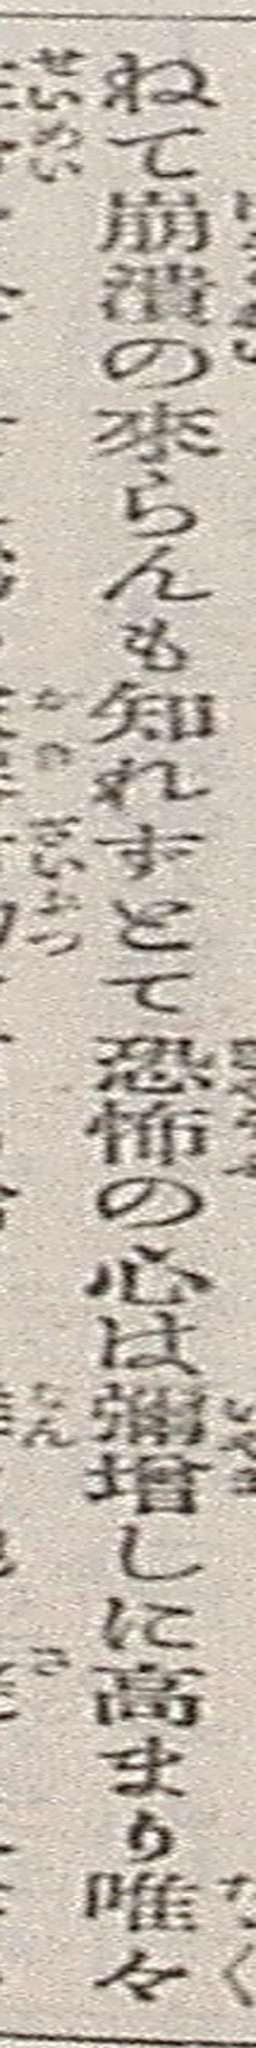ねて崩潰の来らんも知れずとて恐怖の心は弥増しに高まり唯々
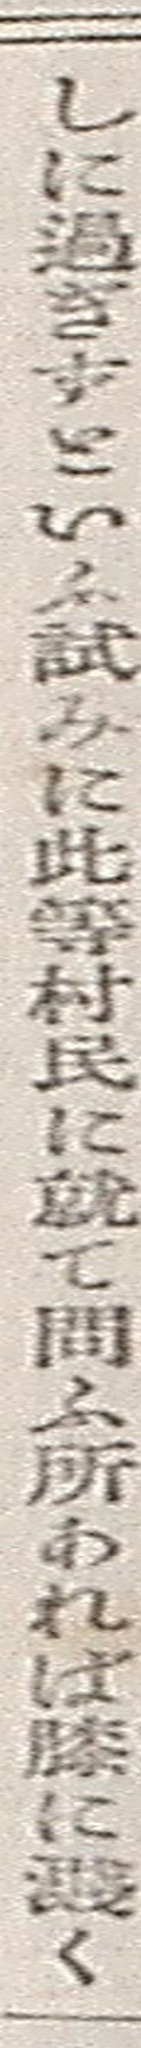しに過ぎずといふ試みに此等村民に就て問ふ所あれば膝に溌く
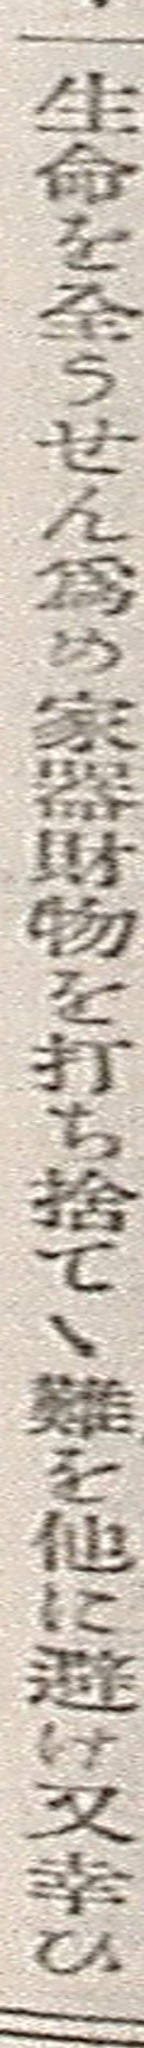生命を全うせん為め家器財物を打ち棄てゝ難を他に避け又幸ひ
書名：風俗畫報臨時増刊第百二十八號　洪水被害録（下）
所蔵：東京大学地震研究所図書室 Earthquake Research Institute Library, The University of Tokyo, JAPAN
